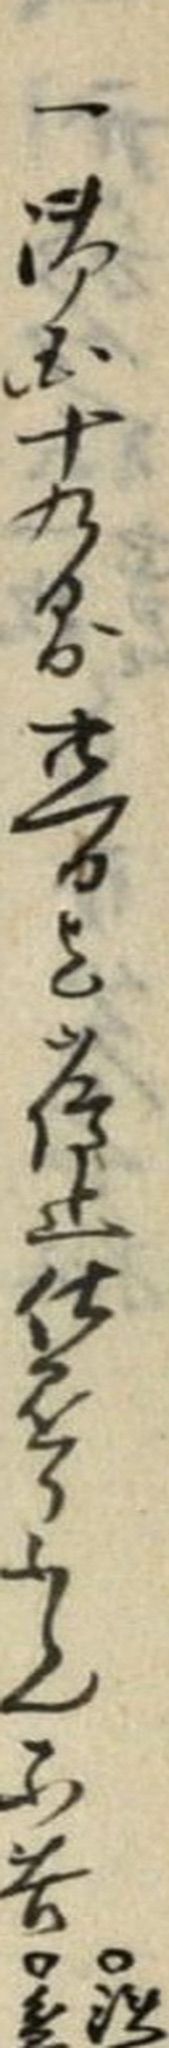一御国廿一日ゟ廿三日迄御停止仕掛りふしん不苦
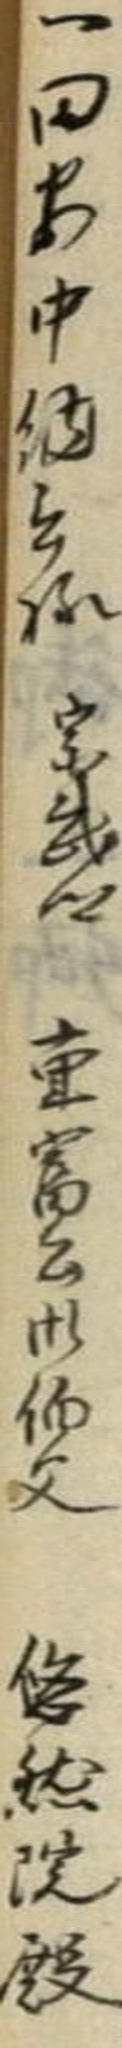一田安中納言様宗武卿重冨公御伯父悠然院殿
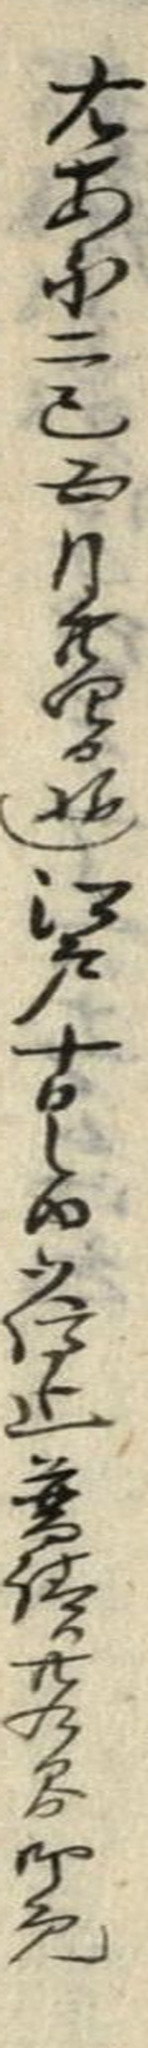右安永二巳五月廿四日逝江戸十日之内御停止普請は廿九日ゟ御免
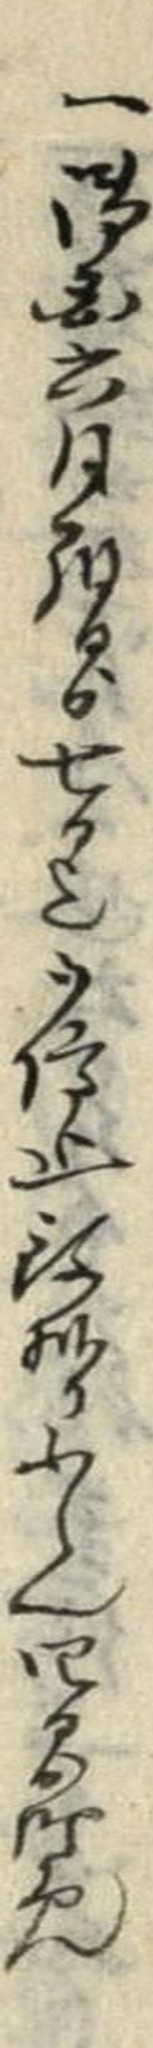一御国六月朔日ゟ七日迄御停止致掛りふしん四日ゟ御免
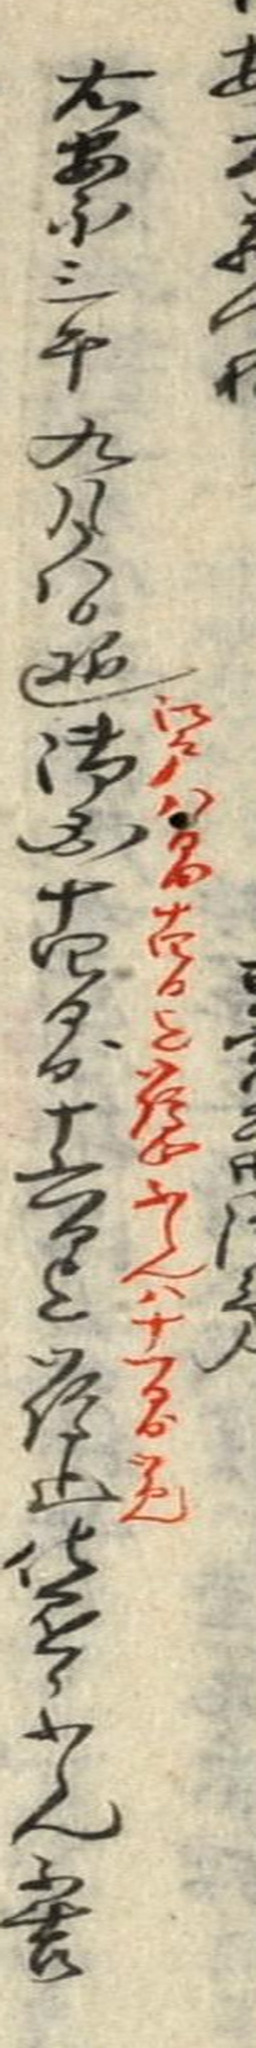右安永三午九月八日逝御国十四日ゟ十六日迄御停止仕懸りふしん不苦
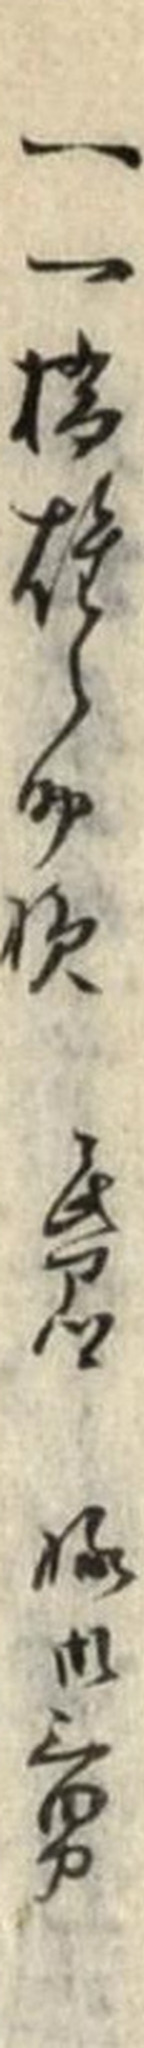一一橋雄之助様民部卿様御三男
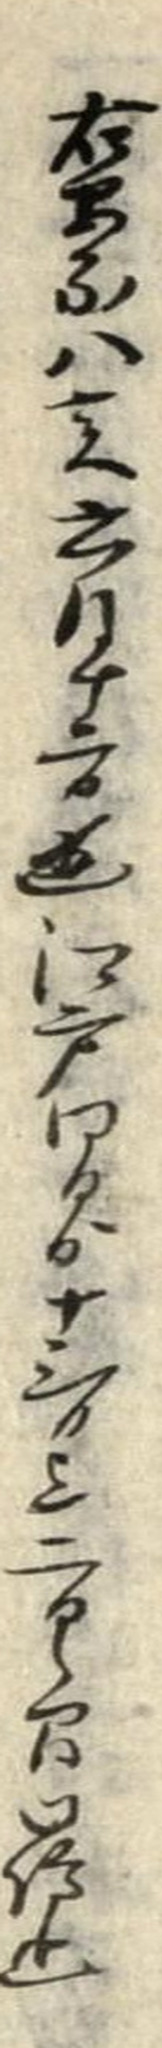右安永八亥六月十二日逝江戸同日ゟ十三日迄二日之間御停止
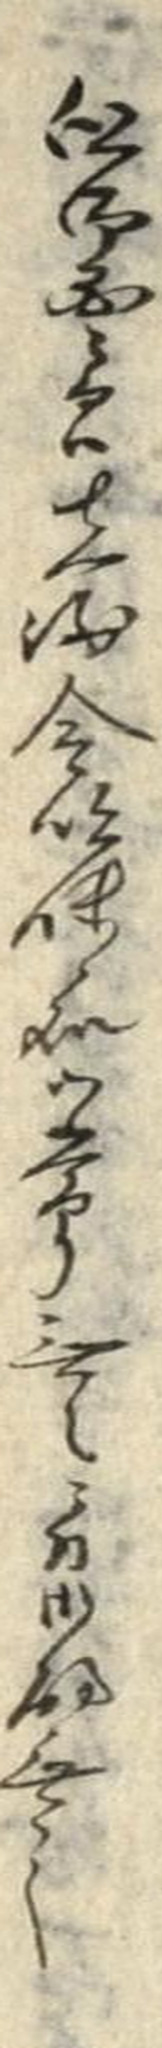但御国にては先例令吟味候処御当り無之に付御触無之
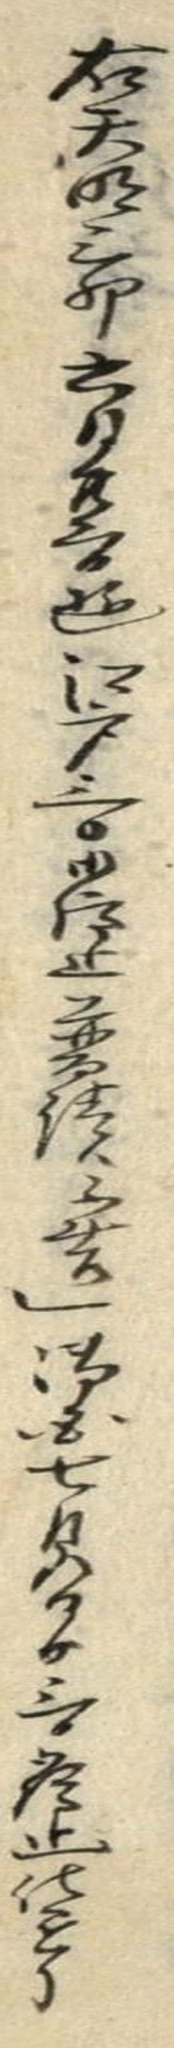右天明三卯六月廿二日逝江戸三日御停止普請は不苦」御国七月五日ゟ三日御停止仕懸り

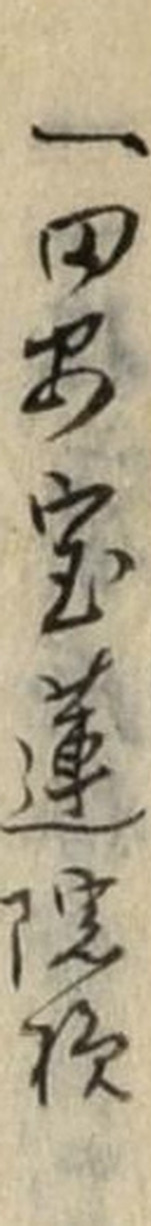一田安宝蓮院様
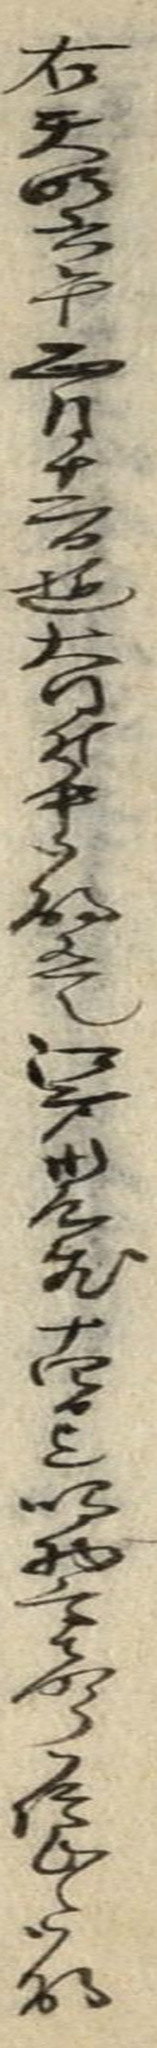右天明六午正月十二日逝大目付中御触有之江戸御屋敷十四日迄鳴物高声御停止之御触
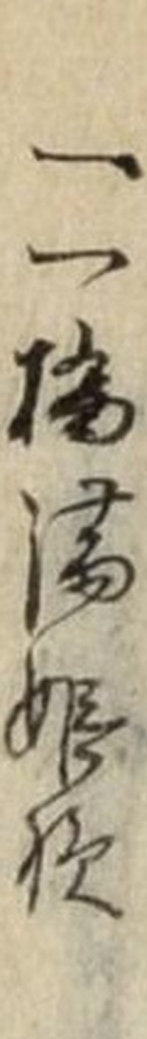一一橋満姫様
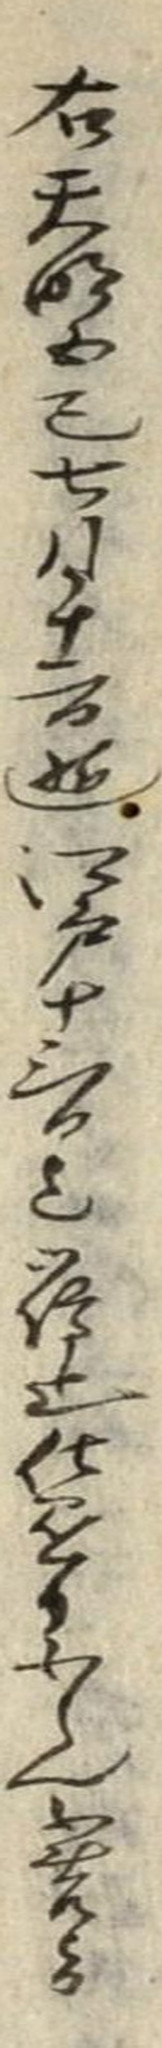右天明五巳七月十二日逝江戸十三日迄御停止仕懸りふしん不苦旨
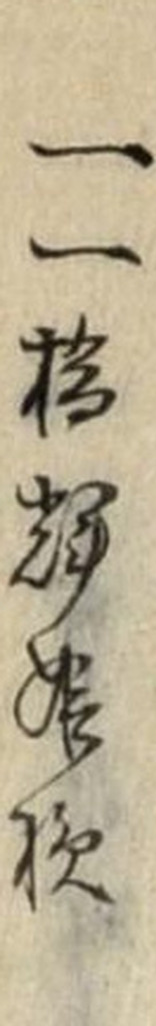一一橋輝姫様
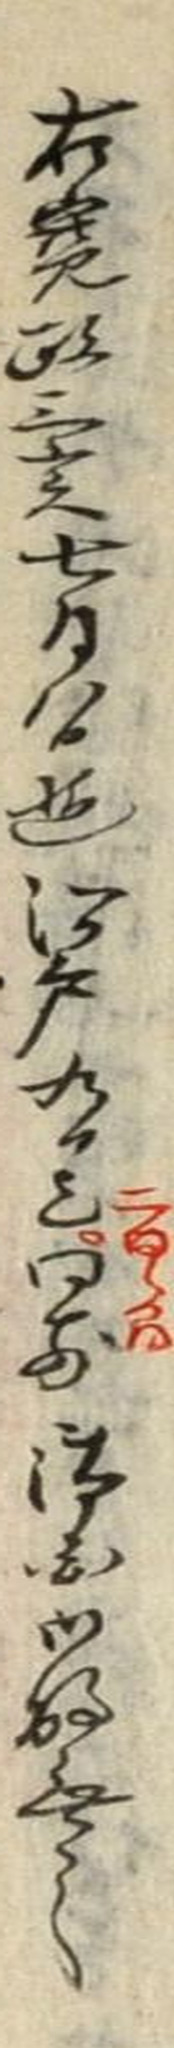右寛政三亥七月八日逝江戸九日迄同前御国御触無之
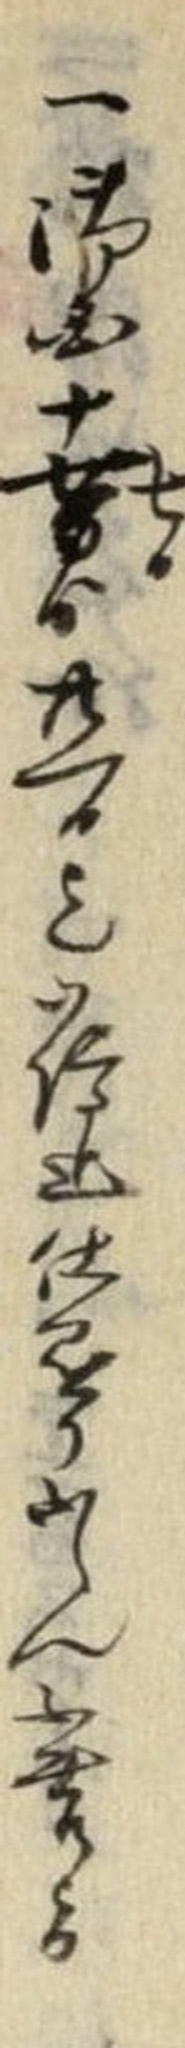一御国十七日ゟ廿一日迄御停止仕懸りふしん不苦旨
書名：御停止異変死失
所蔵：福井県文書館 Fukui Prefectural Archives
